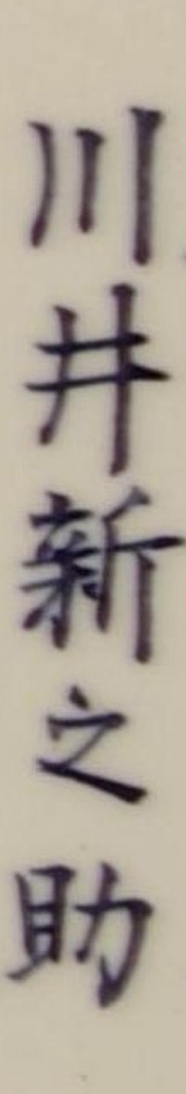川井新之助
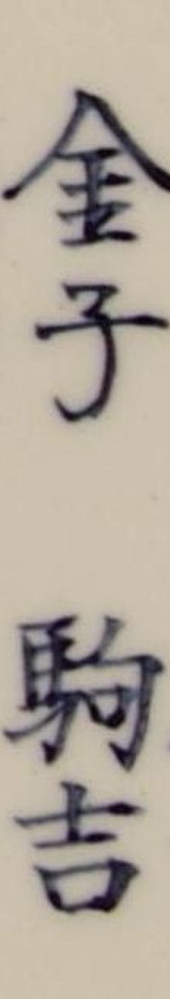金子駒吉
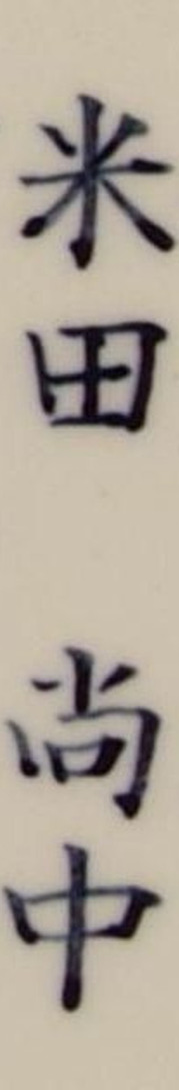米田尚中
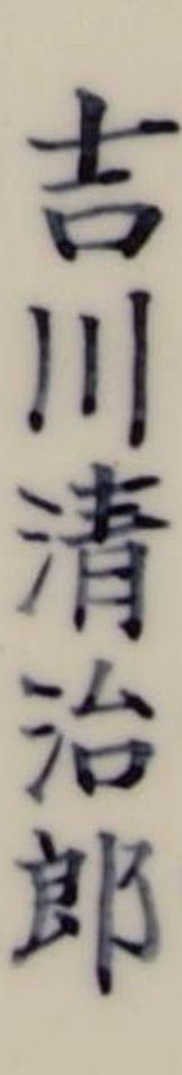吉川清治郎
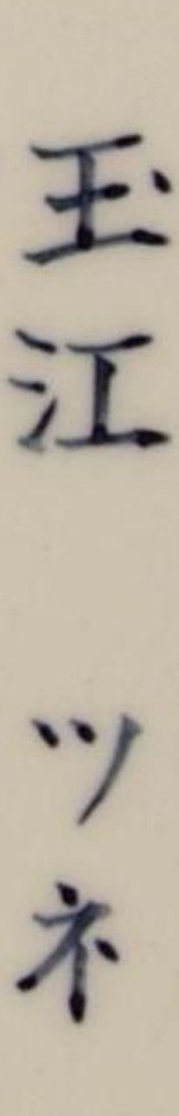玉江ツネ
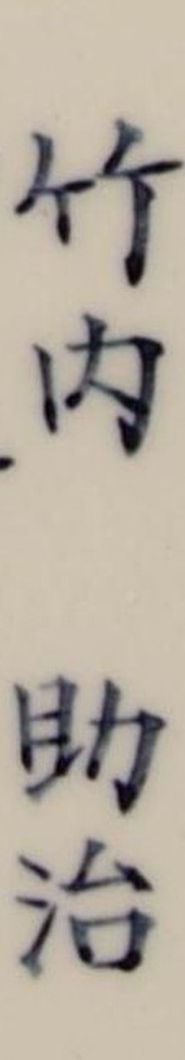竹内助治
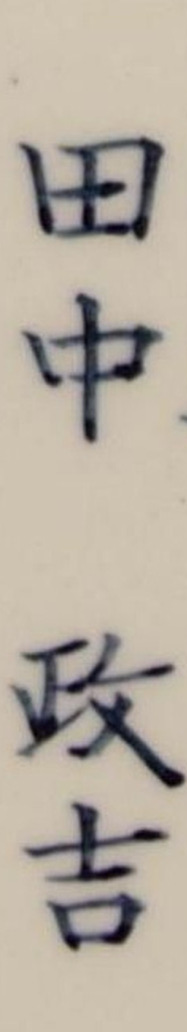田中政吉
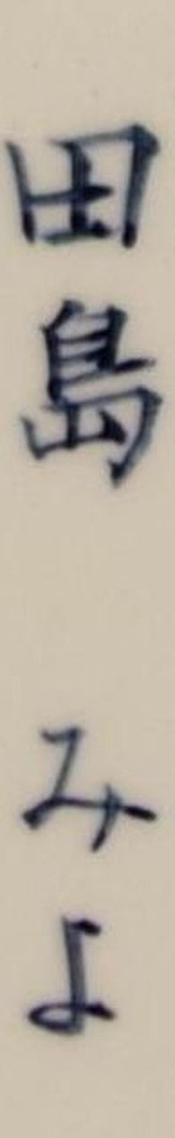田島みよ
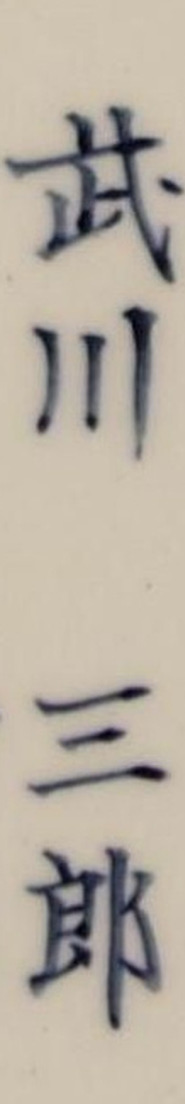武川三郎
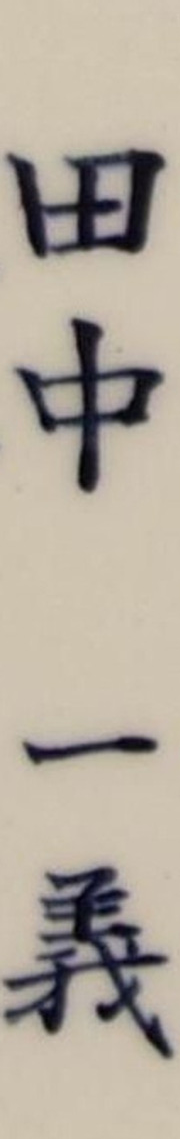田中一義
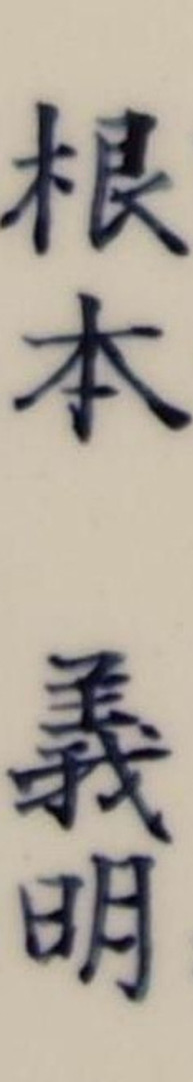根本義明
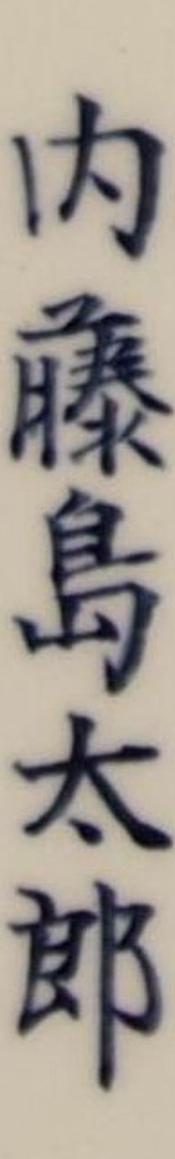内藤島太郎
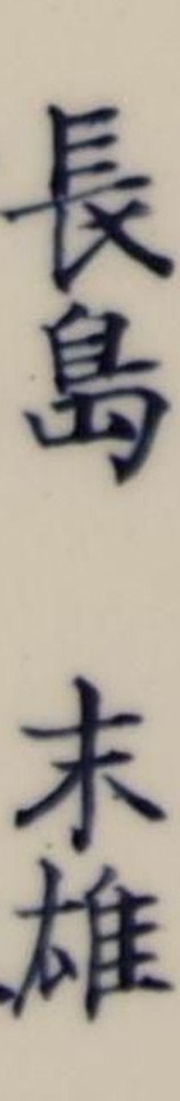長島末雄
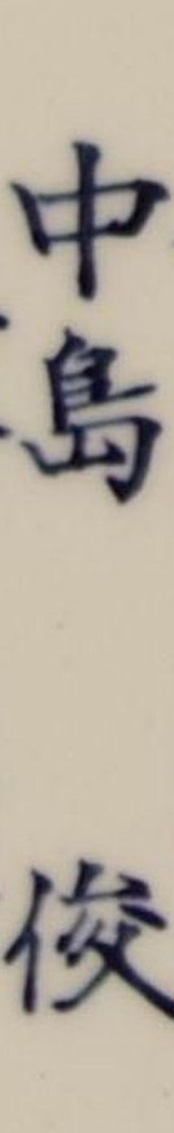中島俊
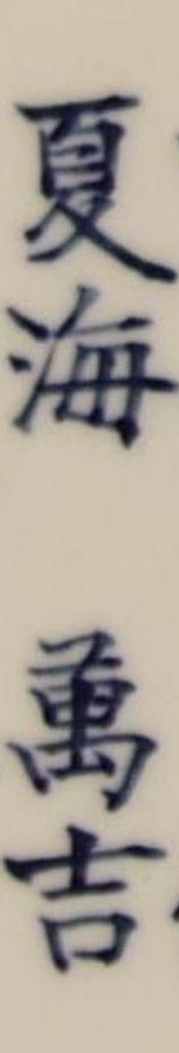夏海萬吉
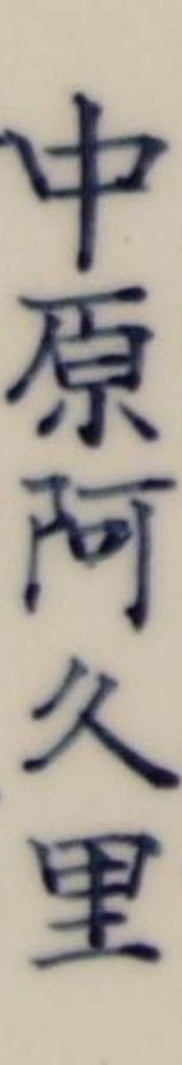中原阿久里
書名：M~S
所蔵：高野山金剛峯寺
